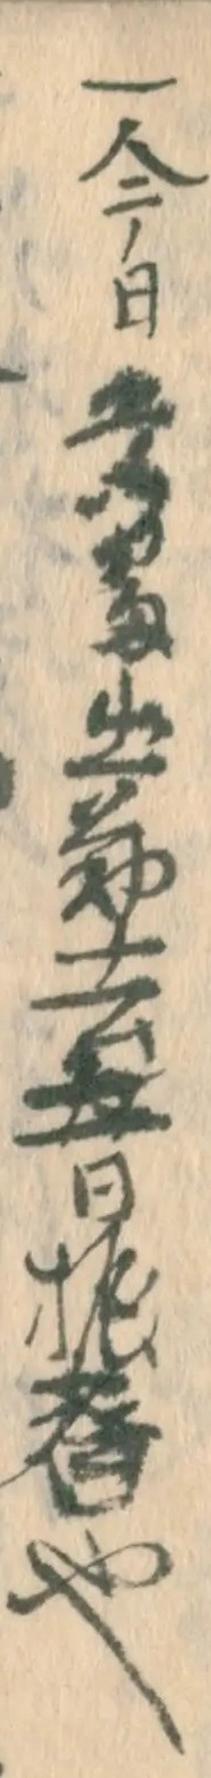一今日当番出勤去五日振替也
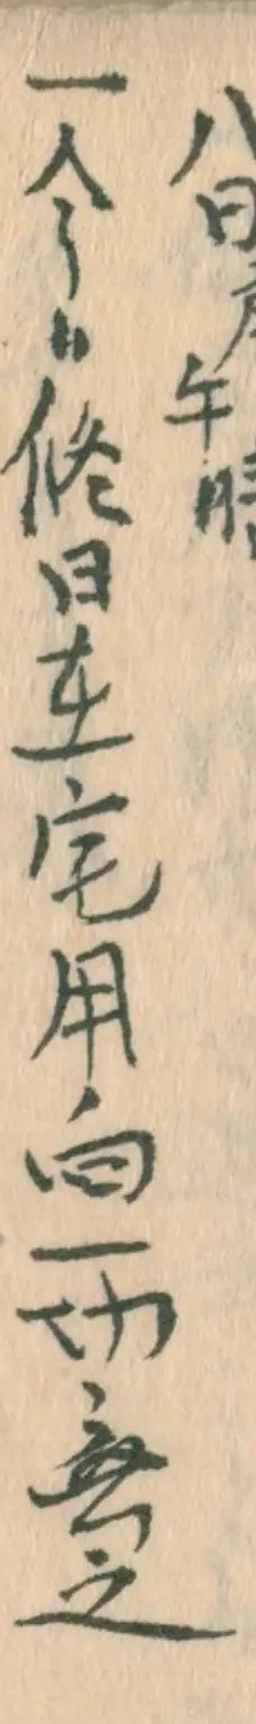一今日終日在宅用向一切無之
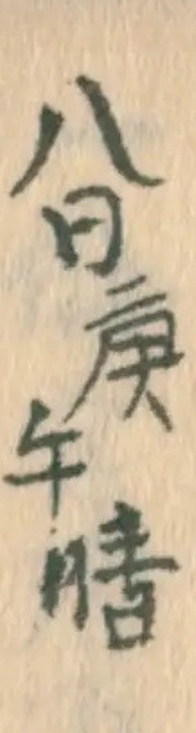八日庚午晴
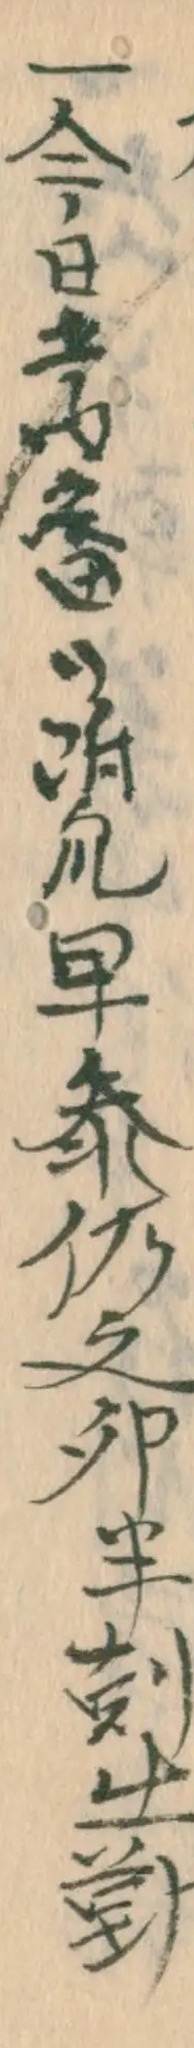一今日当番御附衆早参仍之卯半刻出勤
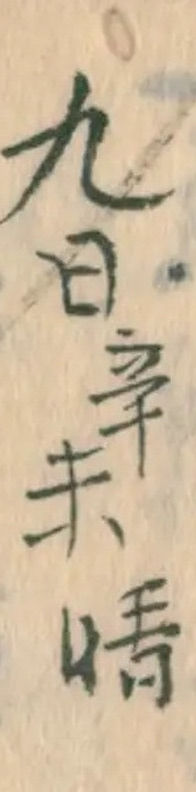九日辛未晴
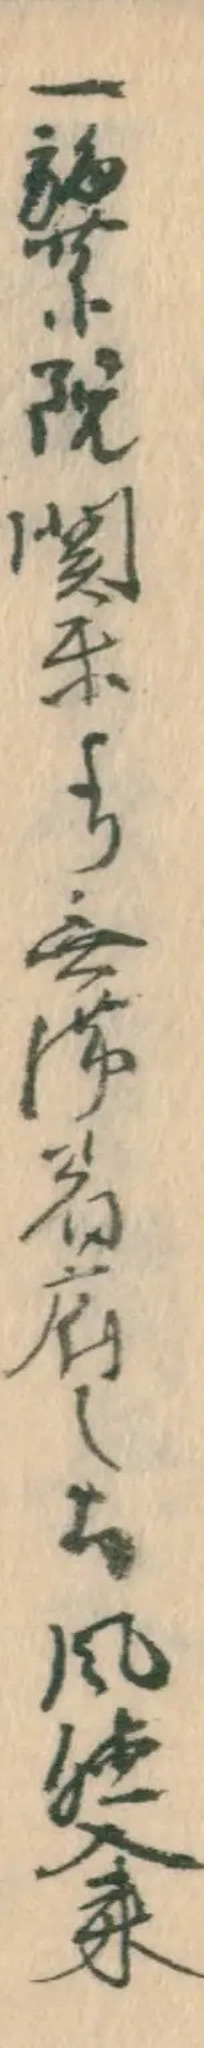一施薬院関東より無滞着府之旨風聴入来
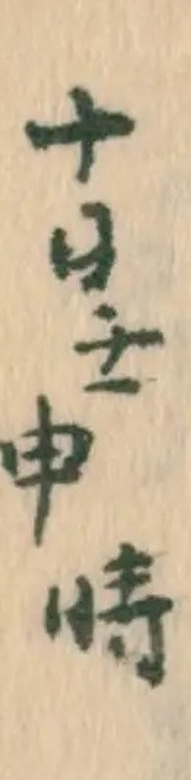十日壬申晴
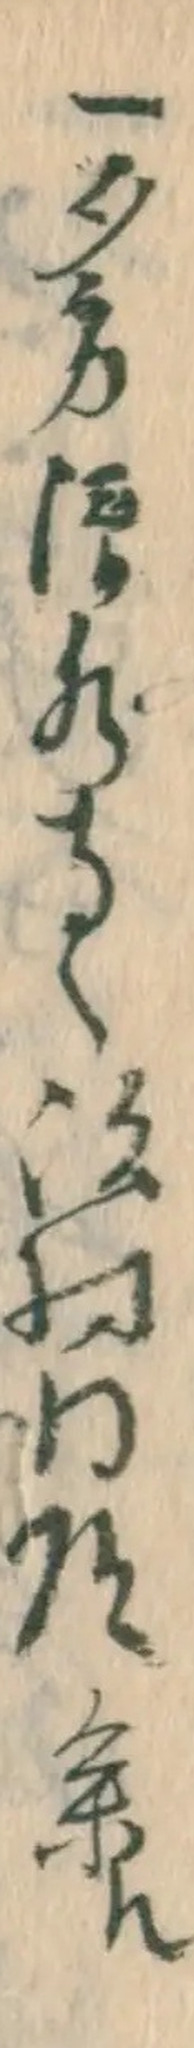一夕方清水寺へ沢村同道参ル
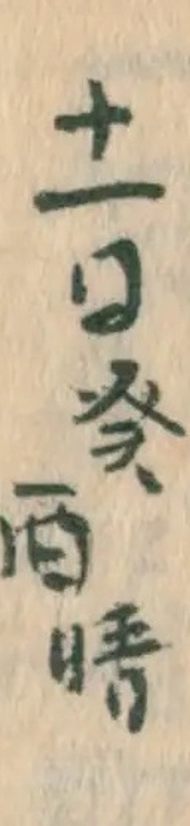十一日癸酉晴

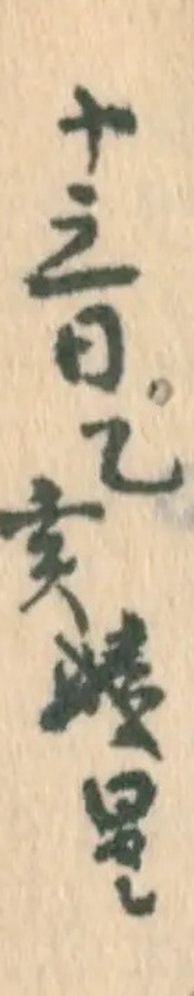十三日乙亥曇
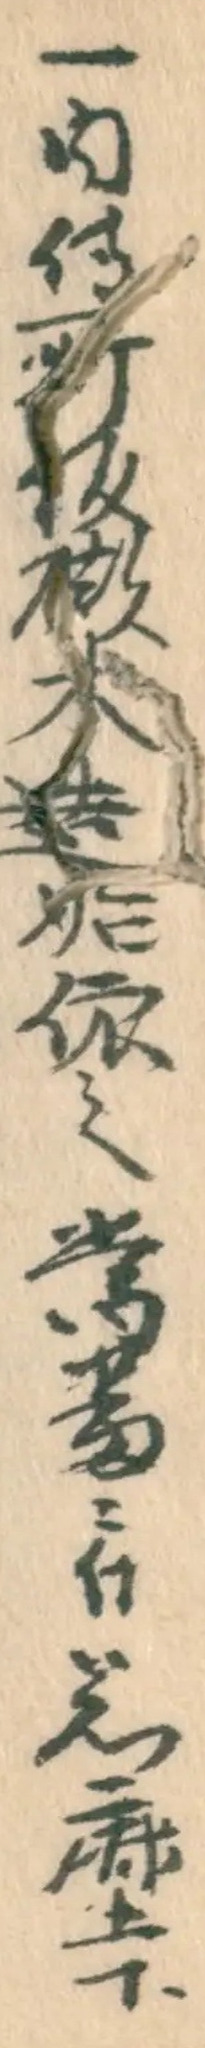一内侍所仮殿木造始依之当番ニ付着麻上下
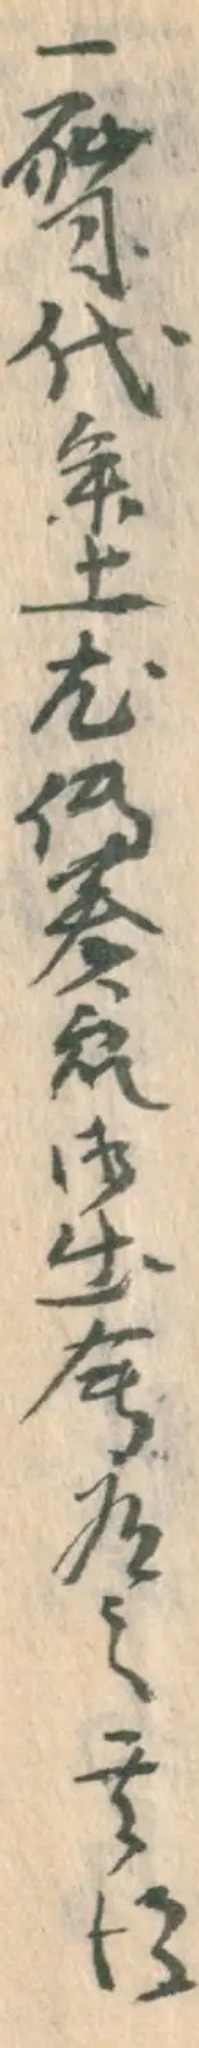一所司代参上尤伝奏衆御出会有之其後
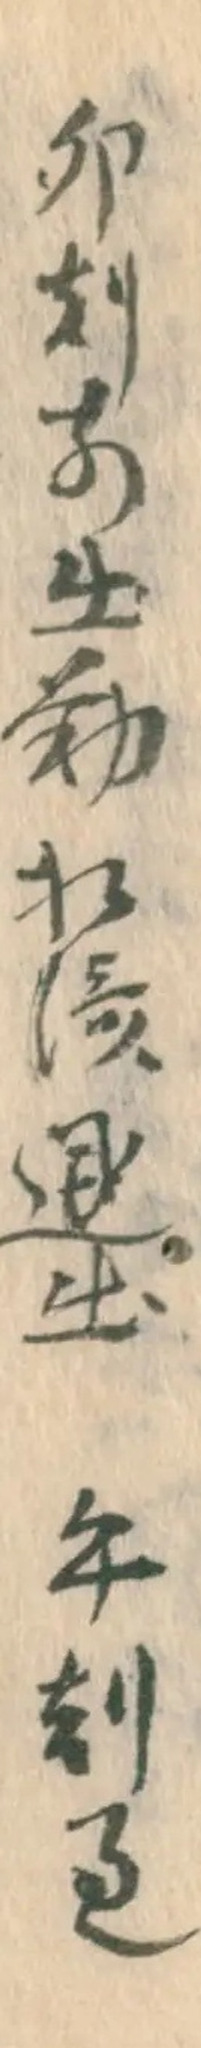卯刻前出勤相済退出午刻過
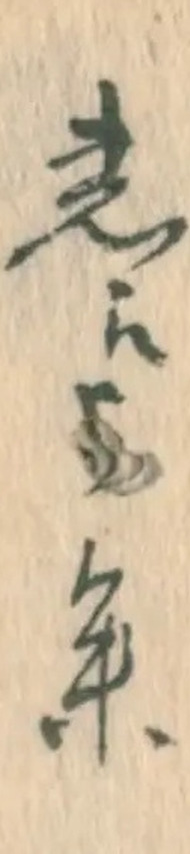表え被参
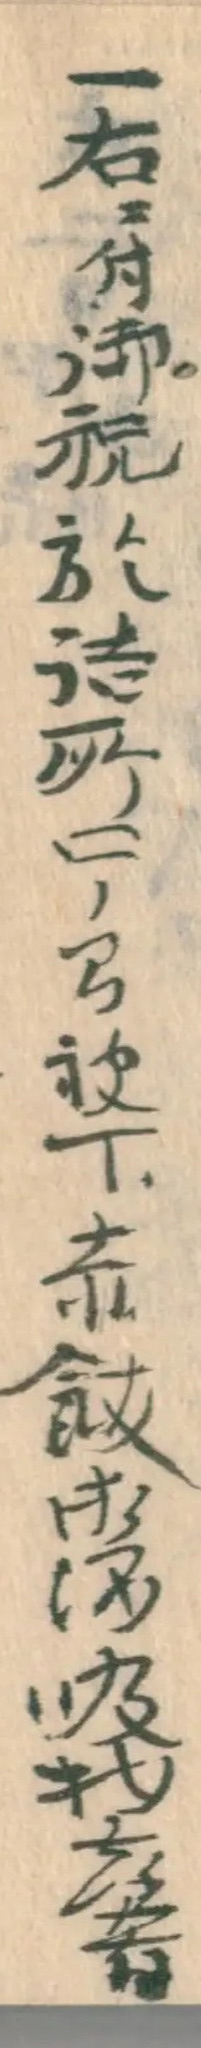一右ニ付御祝於詰所口ノ間被下赤飯御酒吸物台肴
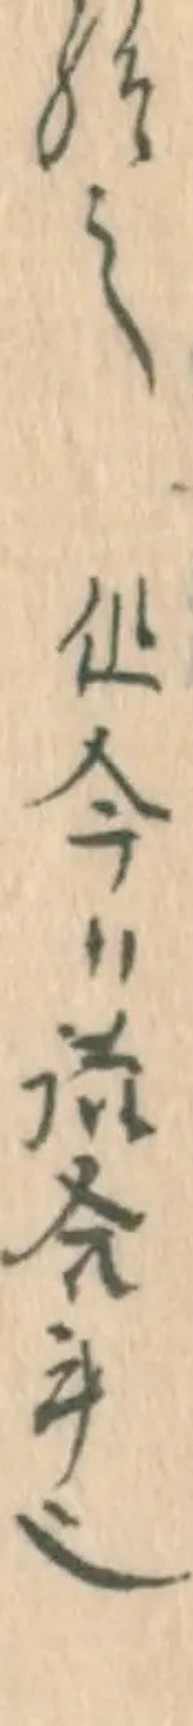給之但今日詰合事也
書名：禁裏御所御用日記. [131]
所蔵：国立国会図書館 National Diet Library, JAPAN
